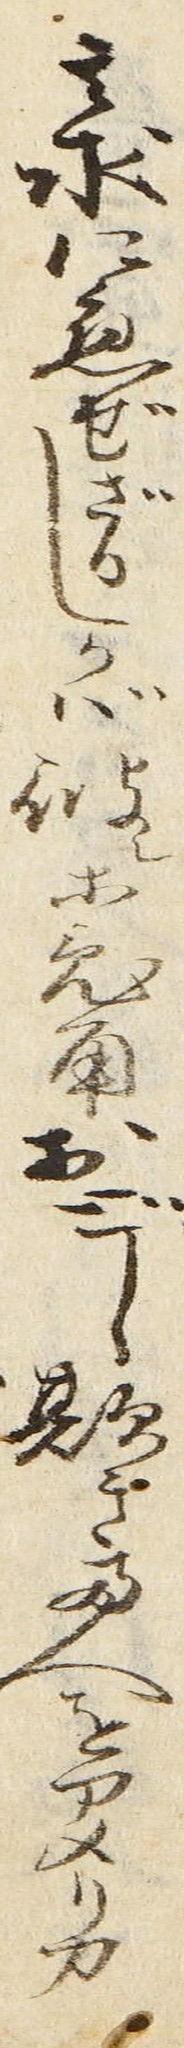其求に応ぜざりしかバ彼レ等兎角おどし歎き両人をアメリカ
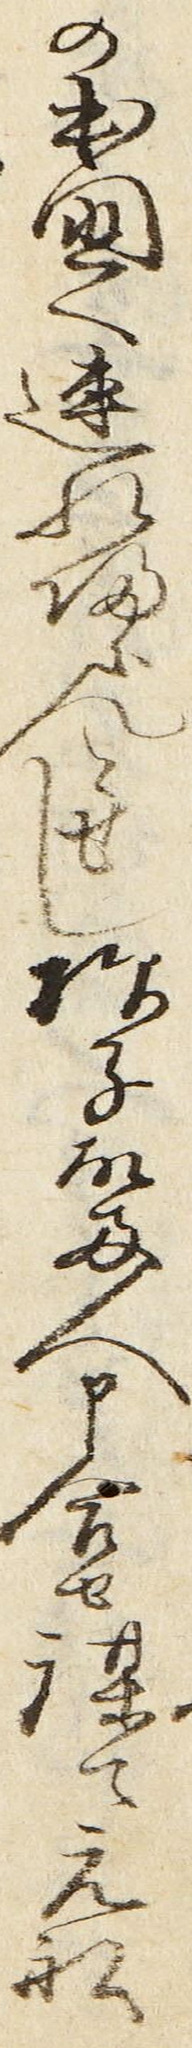の本国へ連れ帰らんとせし様子故両人申合セ謀て元船
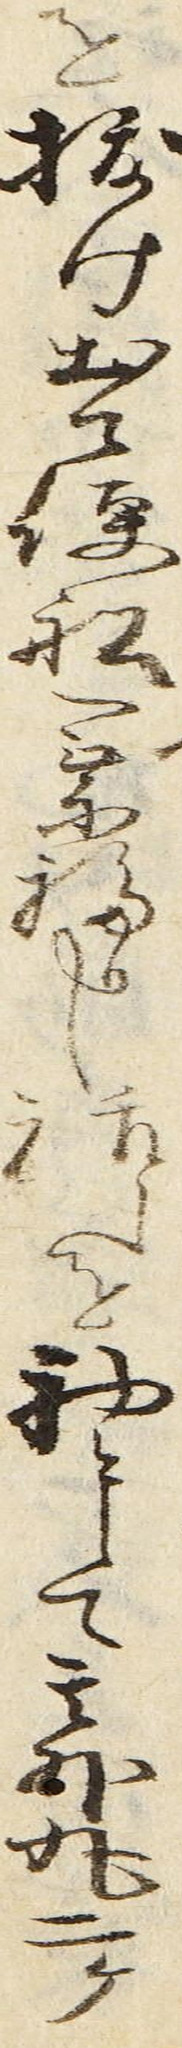を抜け出て便船へ乗移りし話しを初として其外丸二ケ
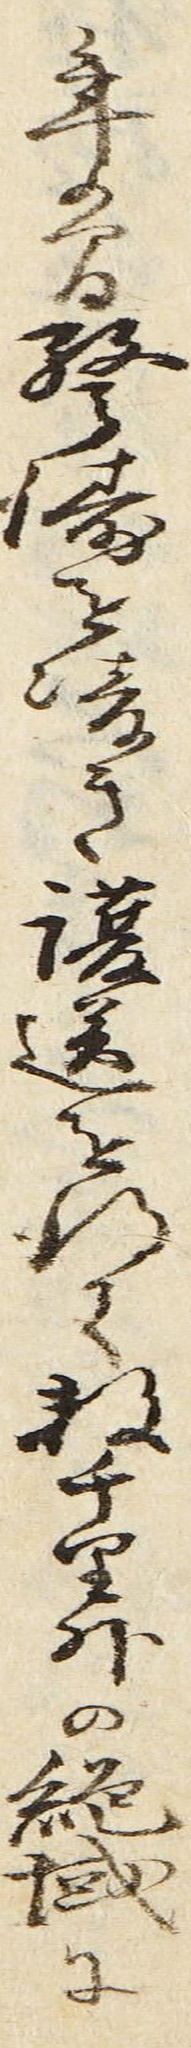年の間警衛を凌き護送を得て数千里外の絶域に
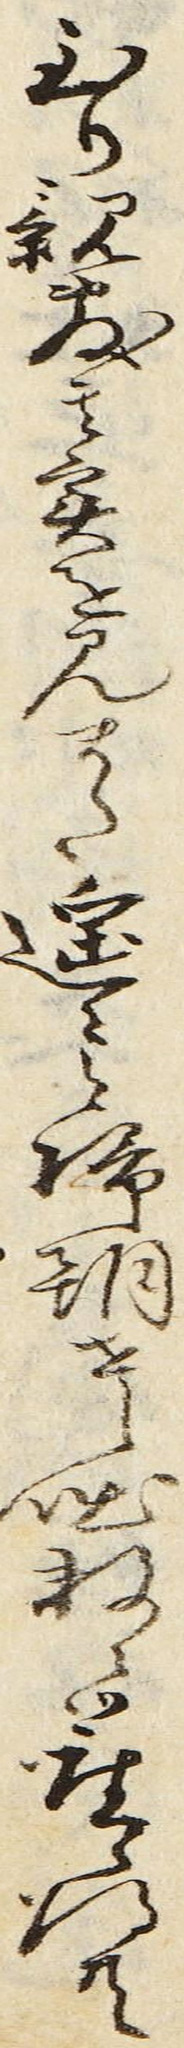至り親敷其実を見また遥々と帰朝せし咄数々御座候得共
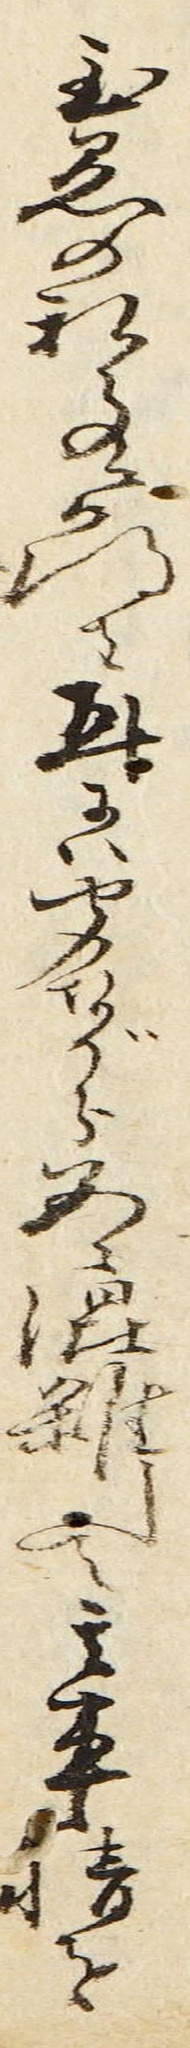至愚の私事ニ候得者耳にハ聞ながら色々混雑して其事情を
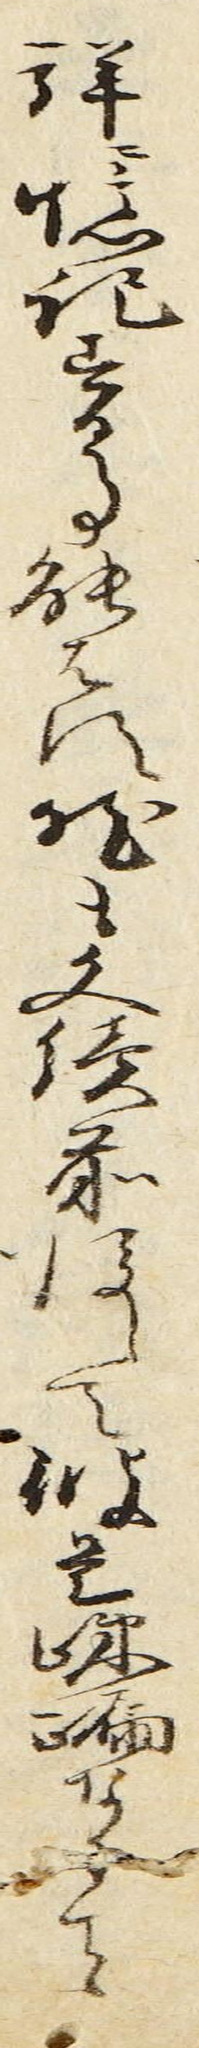詳ニ憶記する事能はす然も文続前後して彼是疎漏なこと
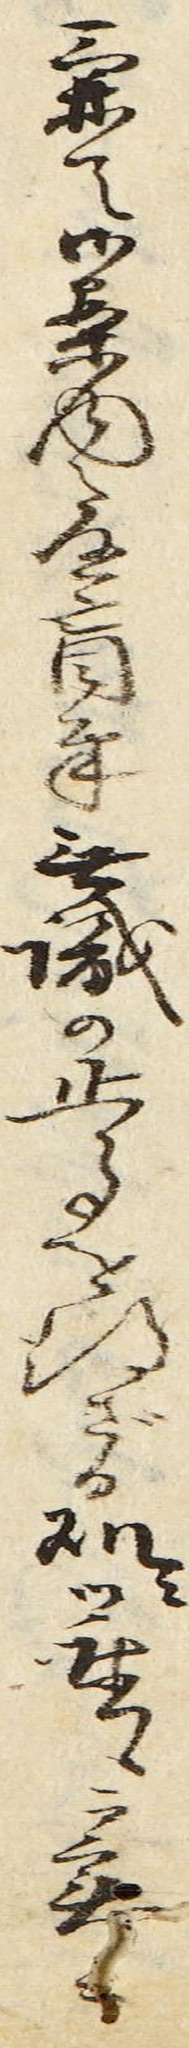兼て御案内之通盲筆無識の止事を得ざる処ニ御座候而実ニ
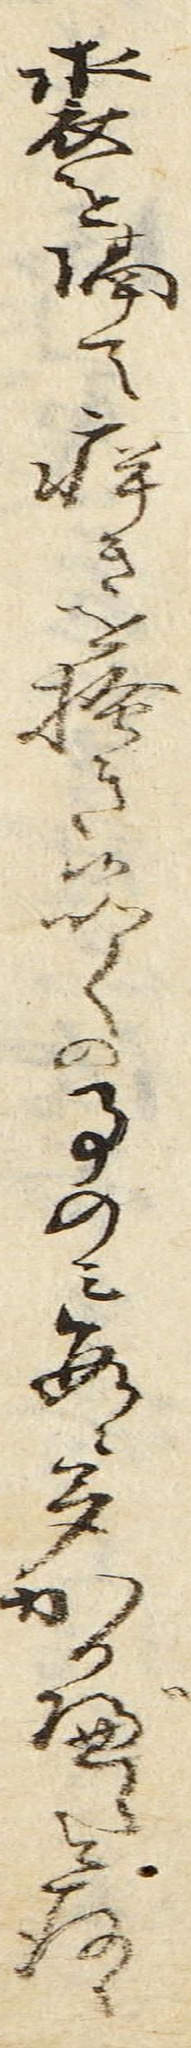裘を隔て痒きを掻き候如くの事のミ毎々多かるべしと存候

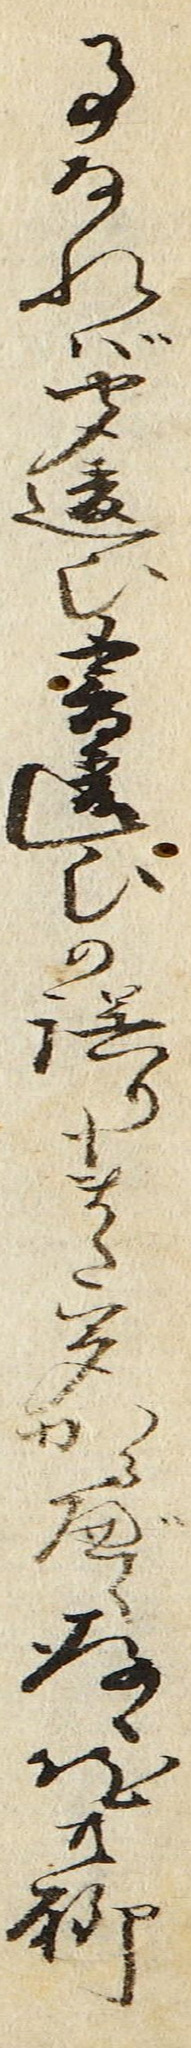事なれバ聞違ひ書違ひの誤りもまた多かるべく存候然共聊
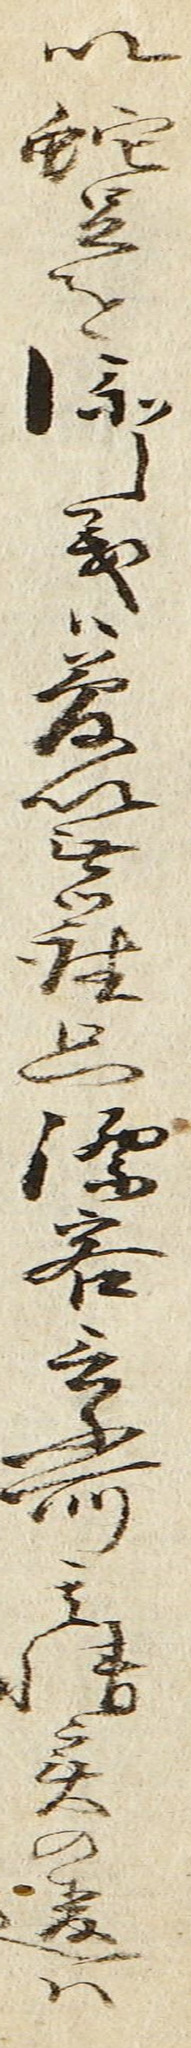以蛇足を添し義ハ爰以無御座只漂客言ふ所其情実の違ハ
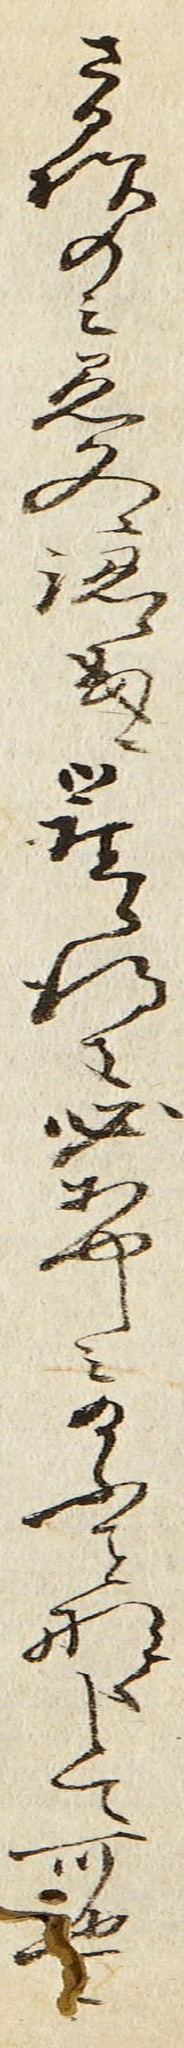さる様のミ愚文ニ認候義ニ御座候得者必あやしミ玉ふことなくして可也
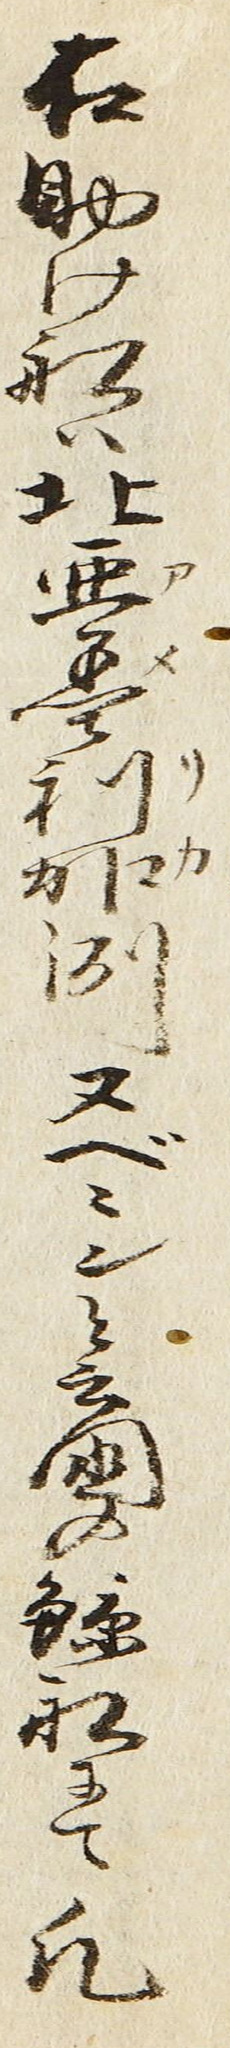右助け船ハ北亜墨利加州ヌベヽンと云国の鯨船にて凡
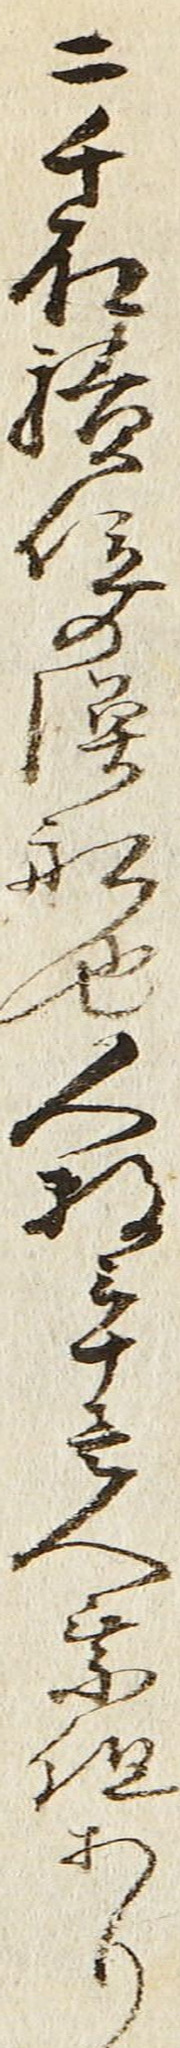二千石積位の漁船也人数三十壱人乗組あり
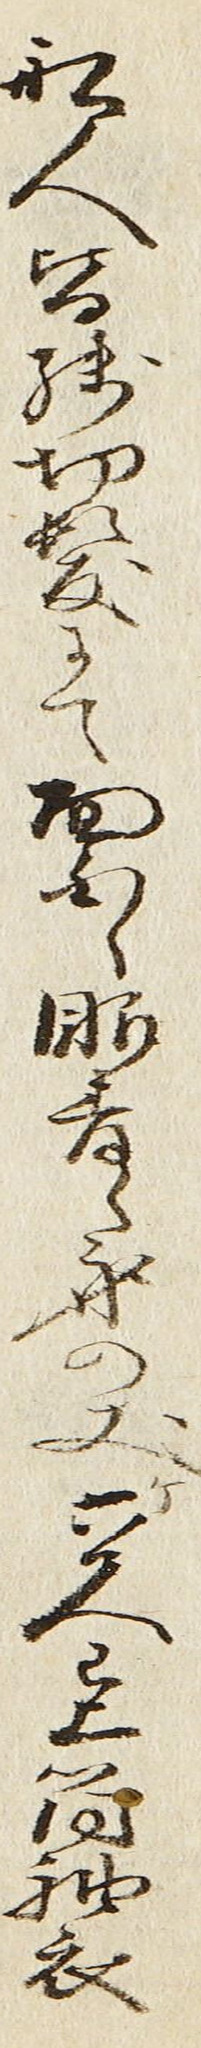船人皆残切髪にて面白し服青く身の丈ケ六尺已上筒袖衣
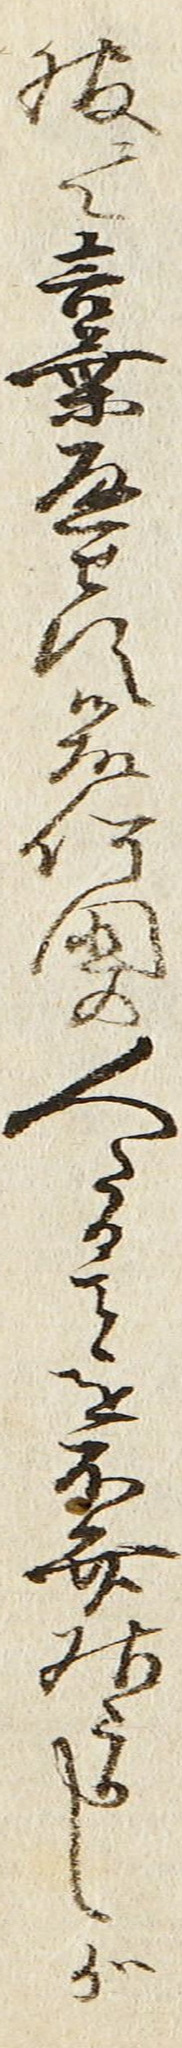服ニて言葉通せす候故何国の人たることを不弁居たりしが
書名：亜墨利加漂流記聞
